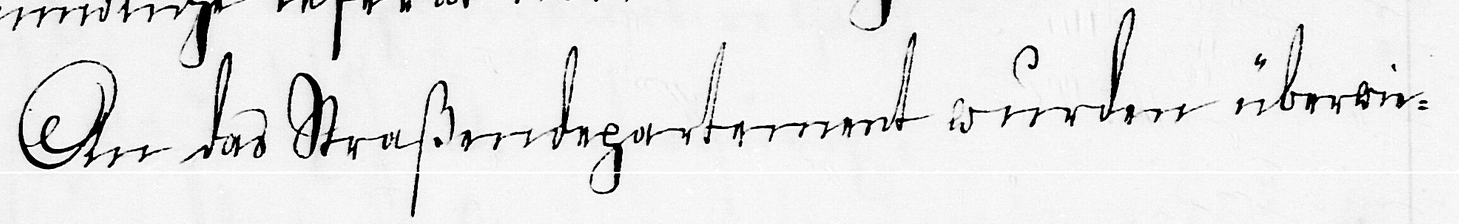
An das Straßendepartement wurden überwie¬
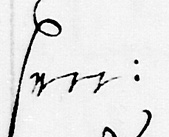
sen:
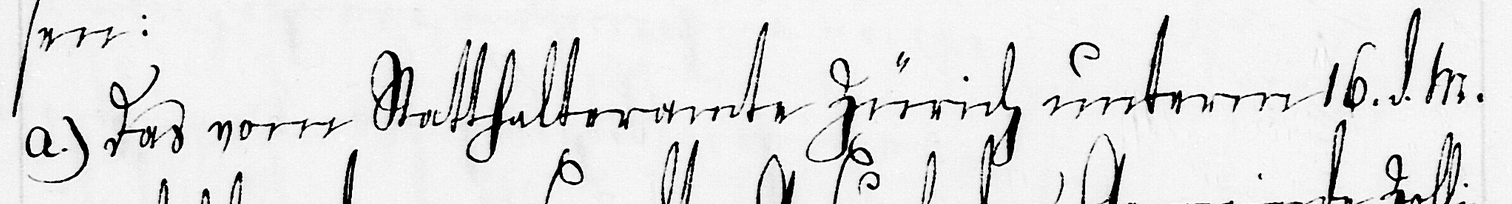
a.) Das vom Statthalteramte Zürich unterm 16. d. M.
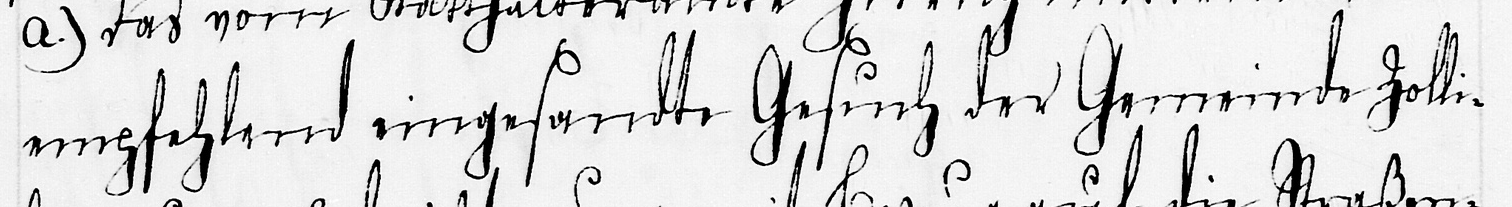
empfehlend eingesandte Gesuch der Gemeinde Zoll¬
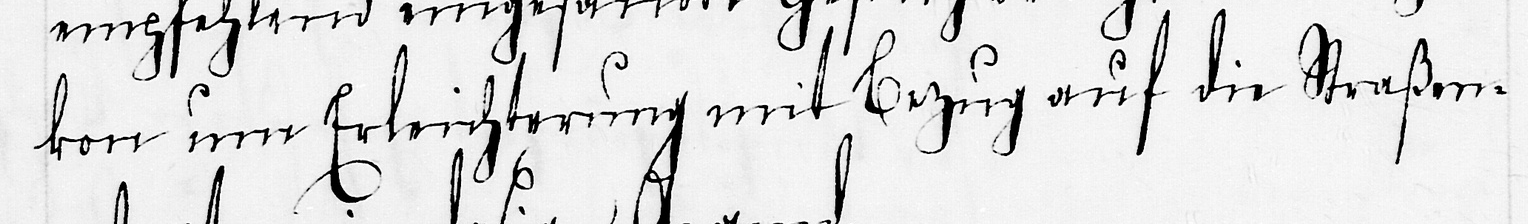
ikon um Erleichterung mit Bezug auf die Straßen¬
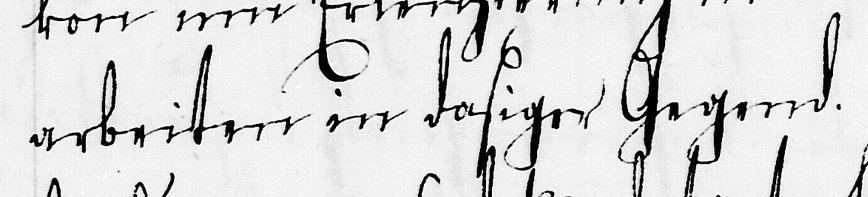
arbeiten in dasiger Gegend.
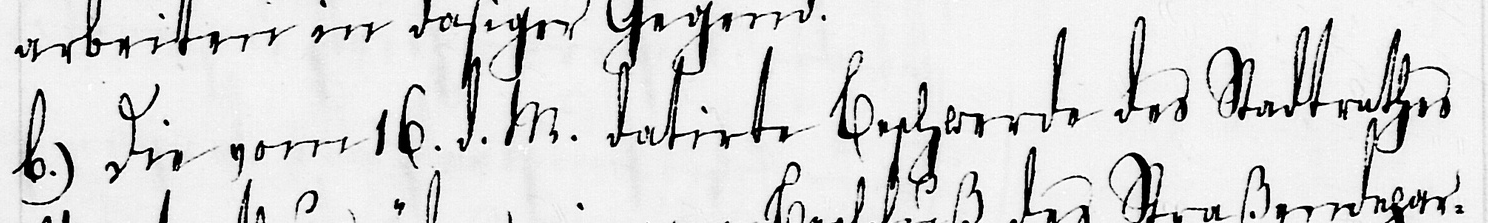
b.) Die vom 16. d. M. datirte Beschwerde des Stadtrathes
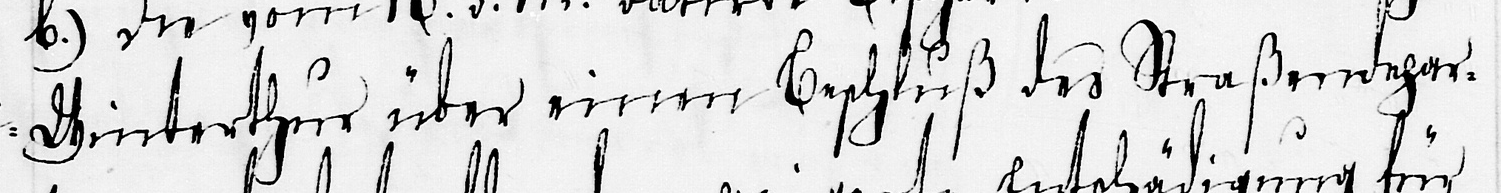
Winterthur über einen Beschluß des Straßendepar¬
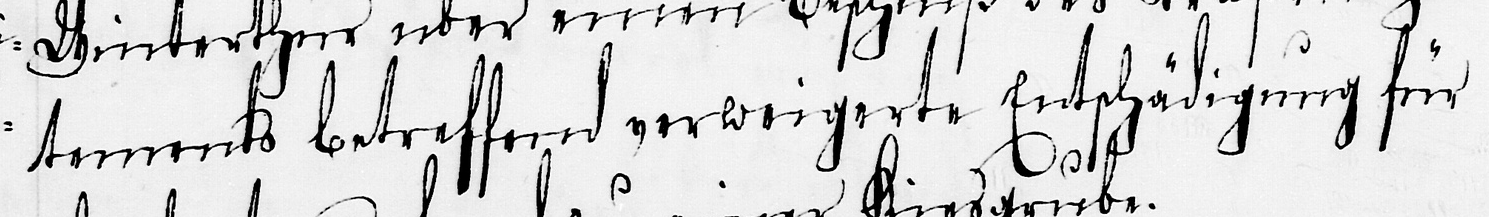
tements betreffend verweigerte Entschädigung für
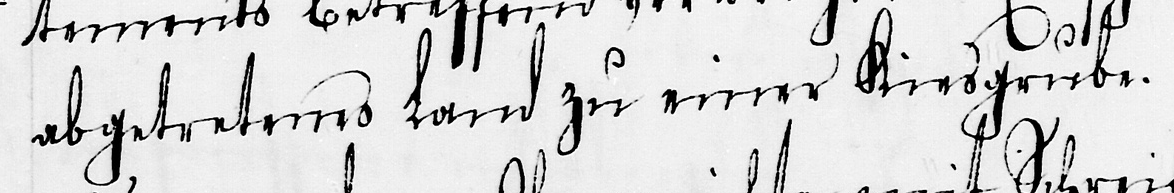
abgetretenes Land zu einer Kiesgrube.
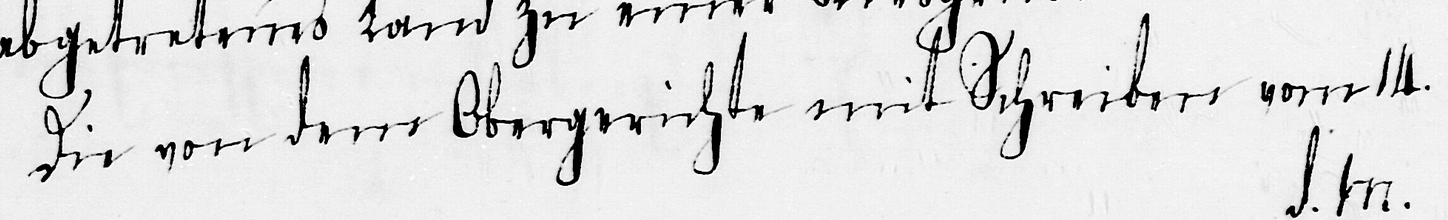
Die von dem Obergerichte mit Schreiben vom 14.
